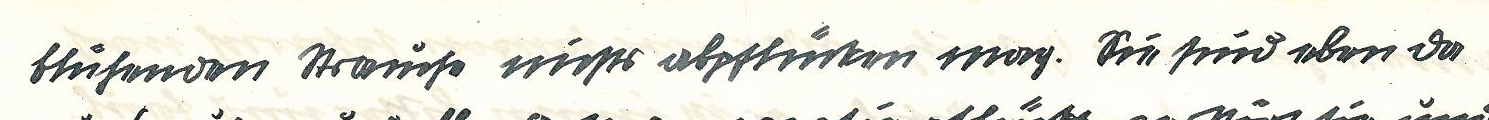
blühenden Strauche nichts abpflücken mag. Sie sind eben da
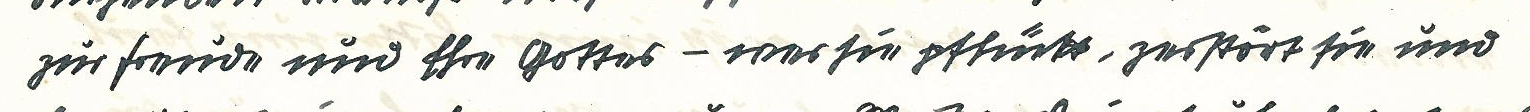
zur Freude und Ehre Gottes – wer sie gepflückt, zerstört sie und
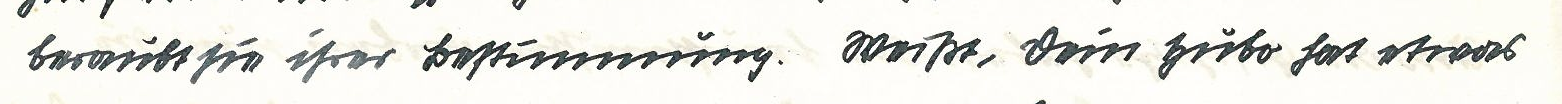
beraubt sie ihrer Bestimmung. Weißt, Dein Hubo hat etwas
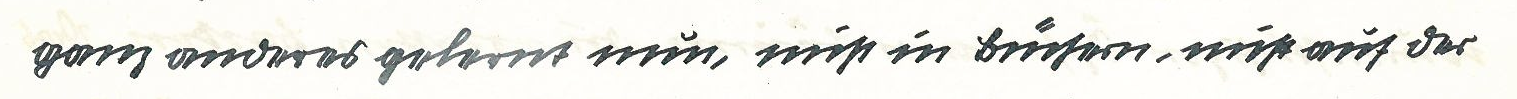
ganz anderes gelernt nun, nicht in Büchern, nicht auf der
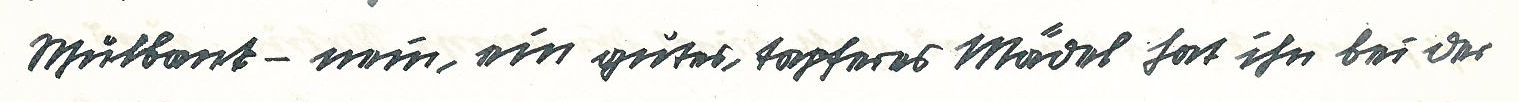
Schulbank – nein, ein gutes, tapferes Mädel hat ihn bei der
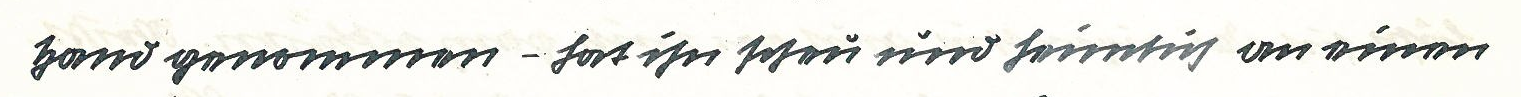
Hand genommen – hat ihn scheu und heimlich an einen
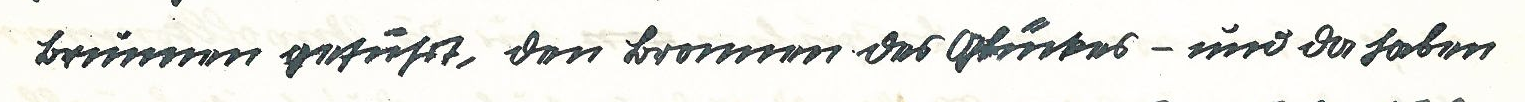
Brunnen geführt, den Brunnen des Glückes – und da haben
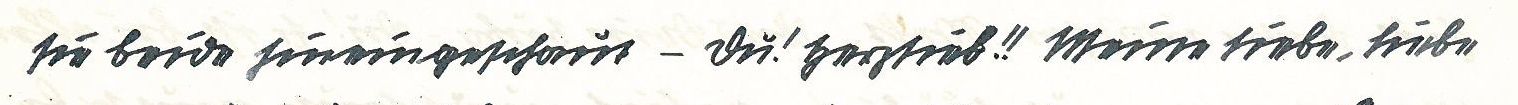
sie beide hineingeschaut – Du! Herzlieb!! Meine liebe, liebe
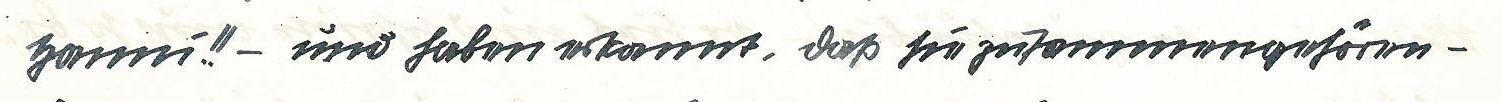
Hanni!! – und haben erkannt, dass sie zusammengehören –
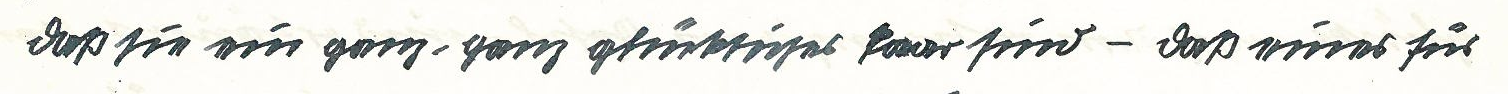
dass sie ein ganz, glückliches Paar sind – dass eines für
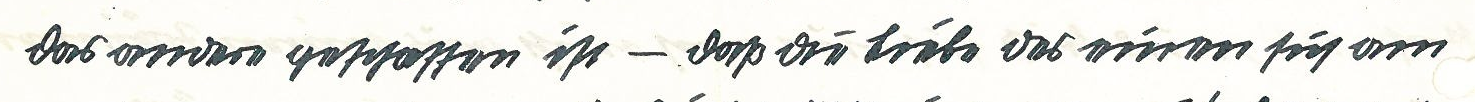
das andere geschaffen ist – dass die Liebe des einen sich am
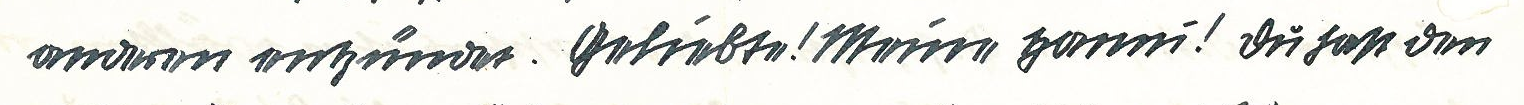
anderen entzündet. Geliebte! Meine! Du hast den
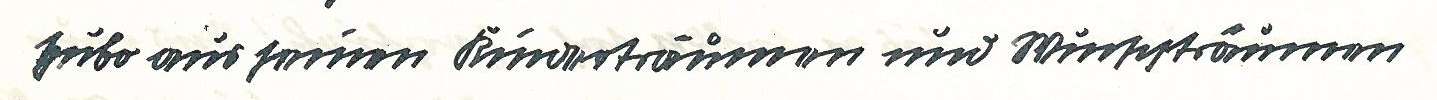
Hubo aus seinen Kinderträumen und Wunschträumen
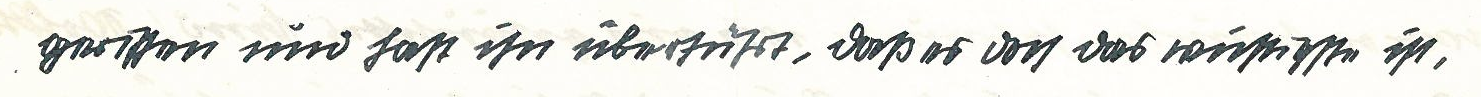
gerissen und hast ihn überführt, dass es doch das wichtigste ist,
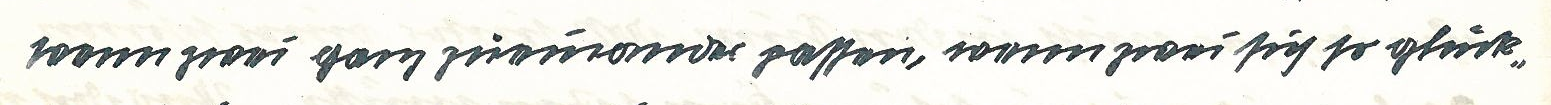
wenn zwei ganz zueinander passen, wenn zwei sich so glück¬
